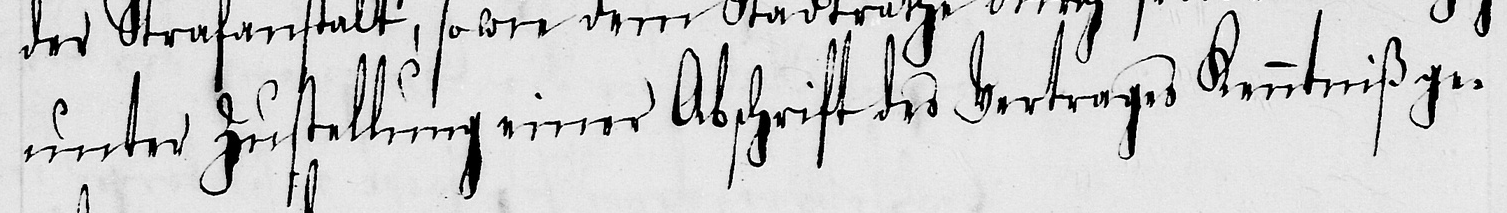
unter Zustellung einer Abschrift des Vertrages Kenntniß ge¬
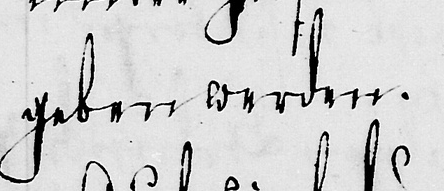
geben werden.
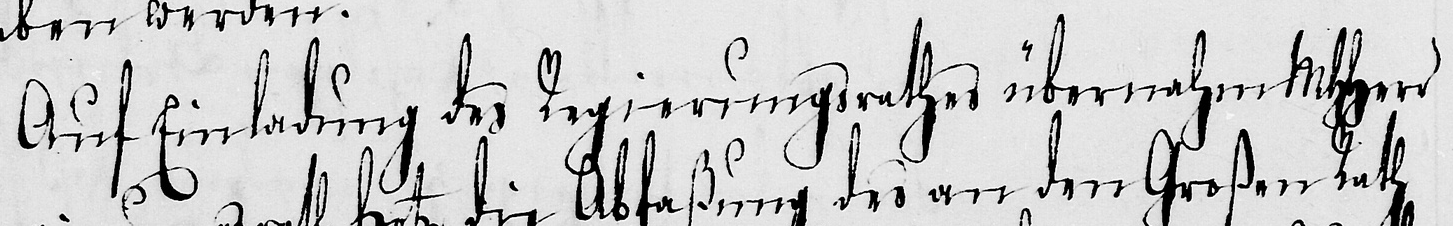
Auf Einladung des Regierungsrathes übernahm MHHerr
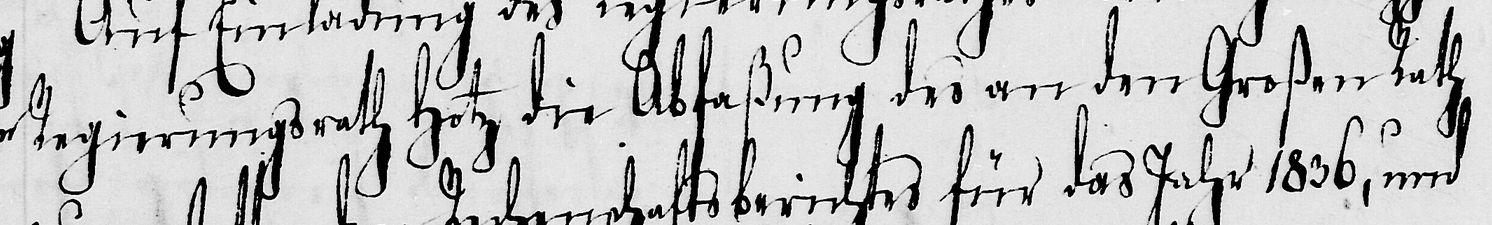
Regierungsrath Hotz die Abfaßung des an den Großen Rath
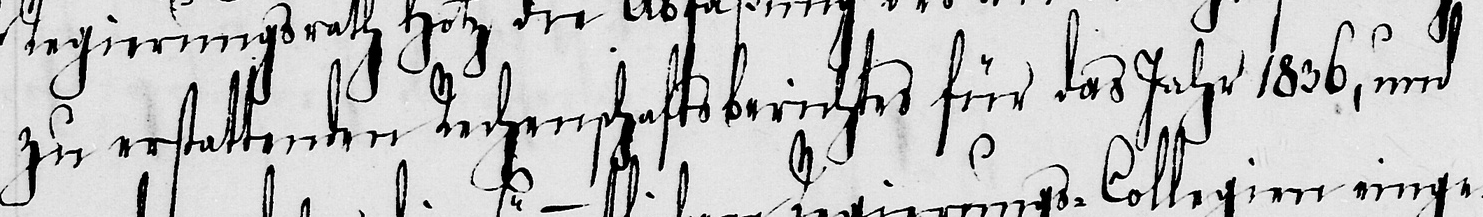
zu erstattenden Rechenschaftsberichtes für das Jahr 1836, und
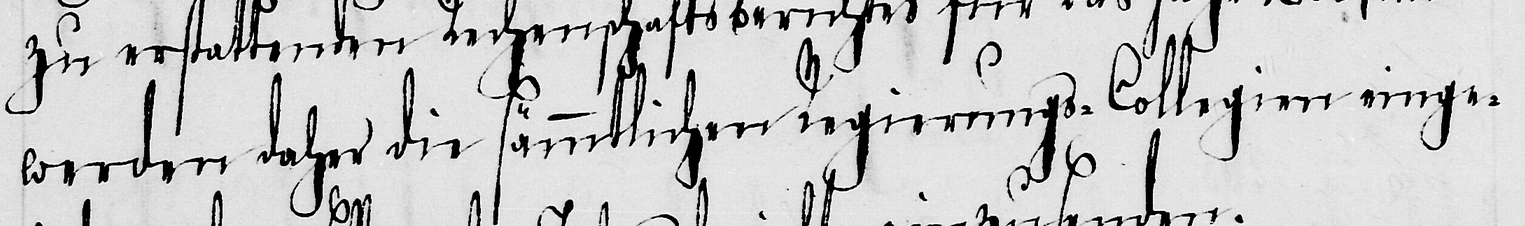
werden daher die sämmtlichen Regierungs-Collegien einge¬
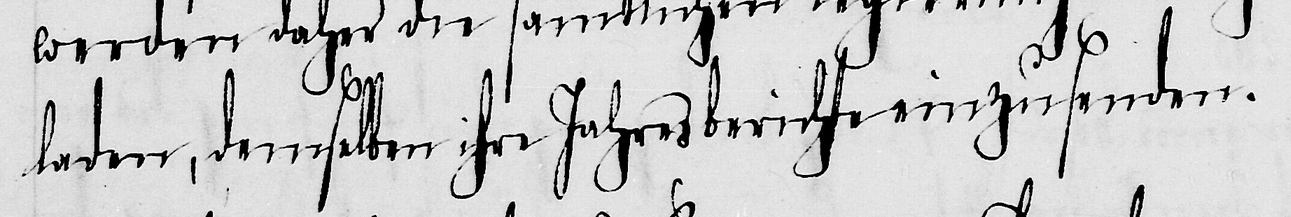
laden, demselben ihre Jahresberichte einzusenden.
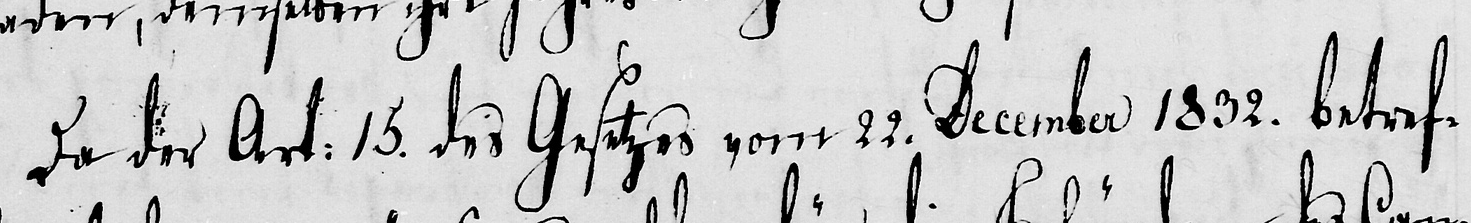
Da der Art: 15. des Gesetzes vom 22. December 1832. betref¬
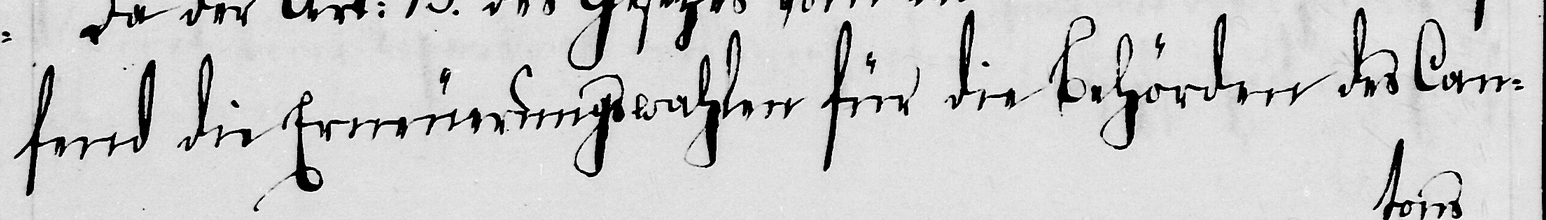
fend die Erneuerungswahlen für die Behörden des Can-
